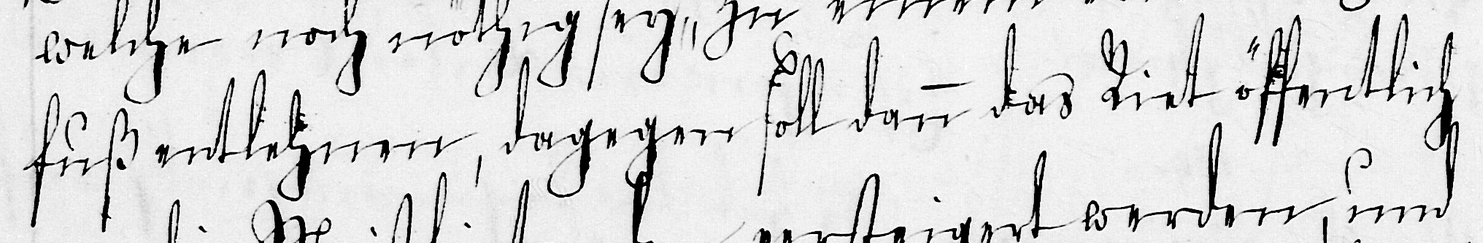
fuß entlehnen, dagegen soll dann das Riet öffentlich
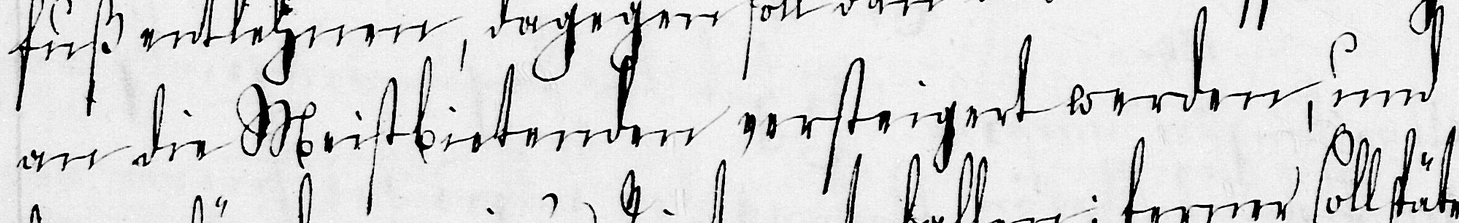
an die Meistbietenden versteigert werden, und
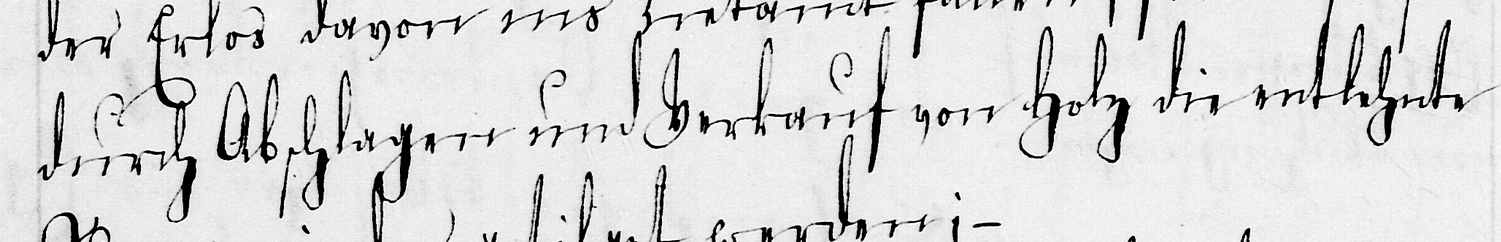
durch Abschlagen und Verkauf von Holz die entlehnte
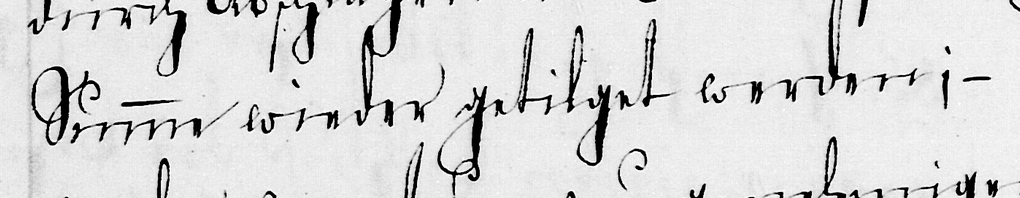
Summe wieder getilget werden; –
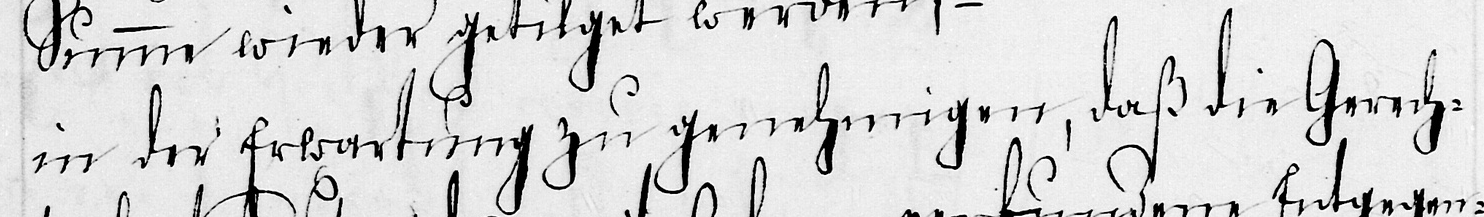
in der Erwartung zu genehmigen, daß die Gerech¬
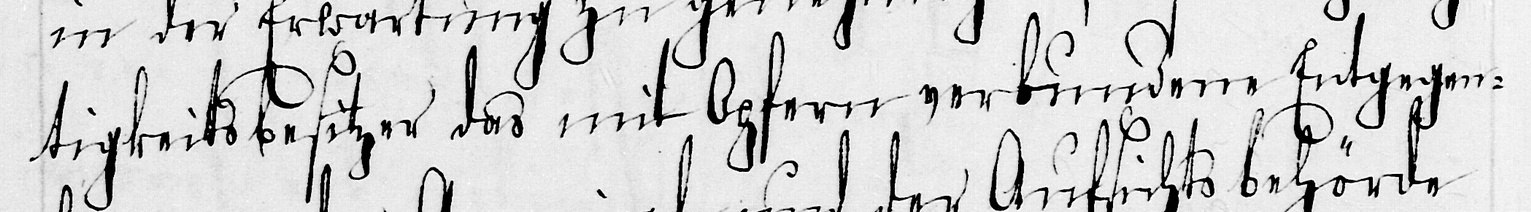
tigkeitsbesitzer das mit Opfern verbundene Entgegen¬
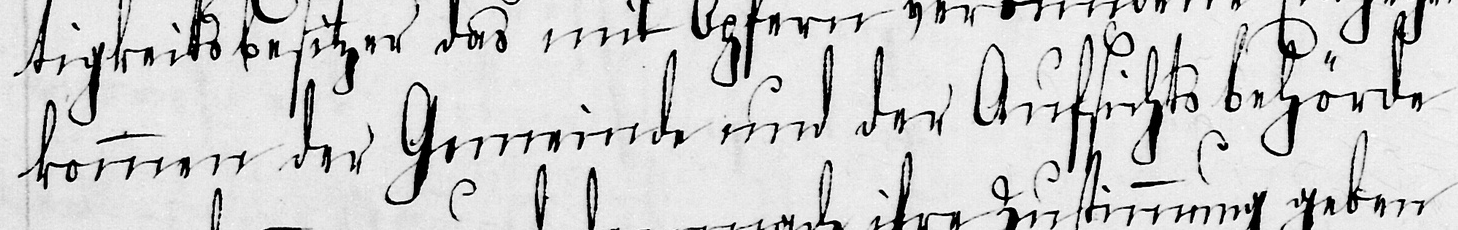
kommen der Gemeinde und der Aufsichtsbehörde
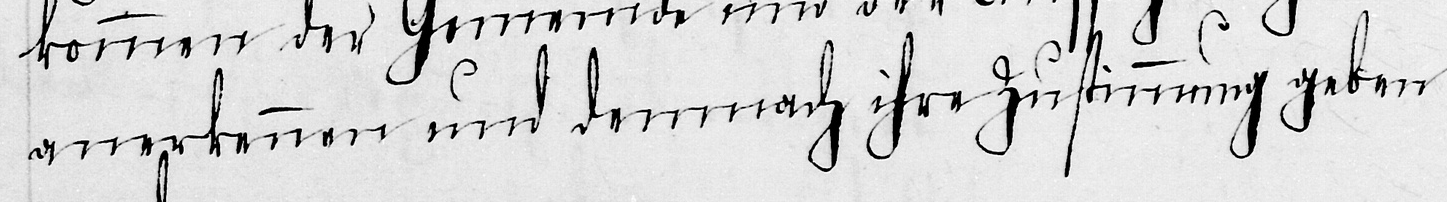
anerkennen und demnach ihre Zustimmung geben
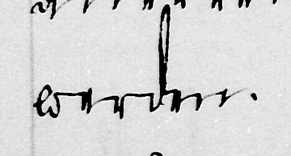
werden.
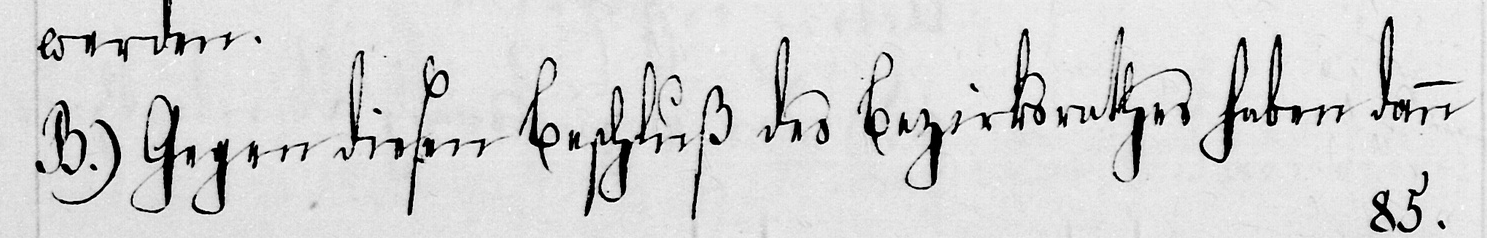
B.) Gegen diesen Beschluß des Bezirksrathes haben dan¬
